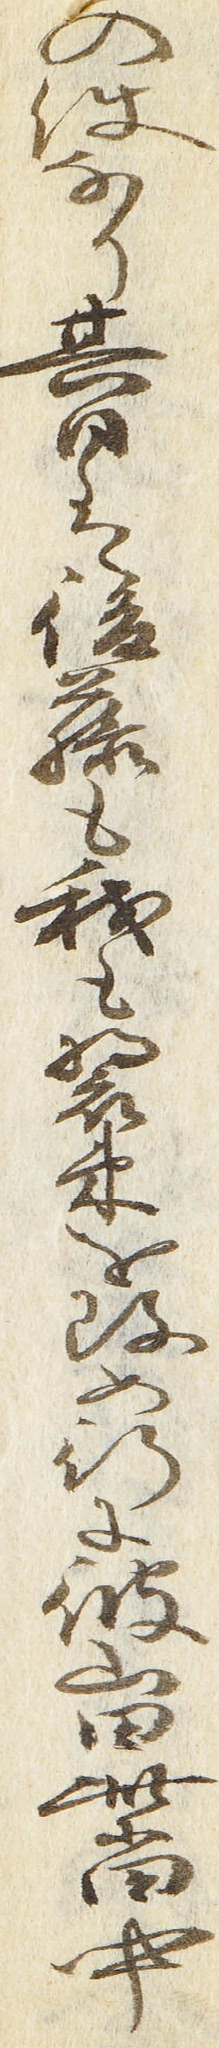の使なり其日は後藤も我も装束を改め行に彼山田柴田中
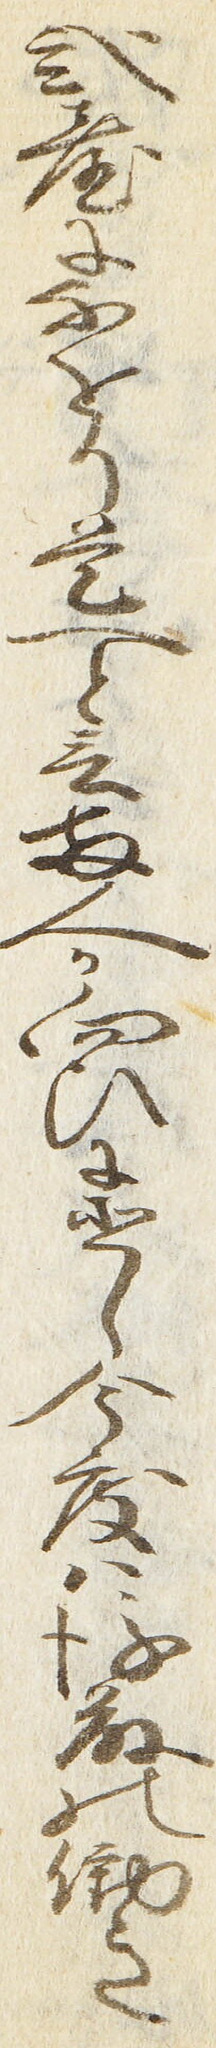式台になをり是へと云両人か向ひに直し今度は後藤の働き
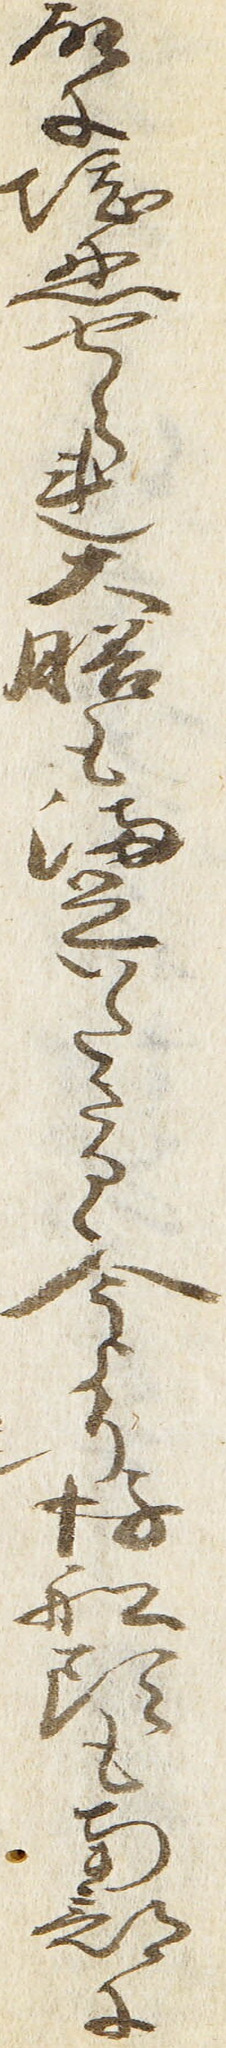故に堪忍せられ大膳も満足いたさるゝ今より後船頭も南部に
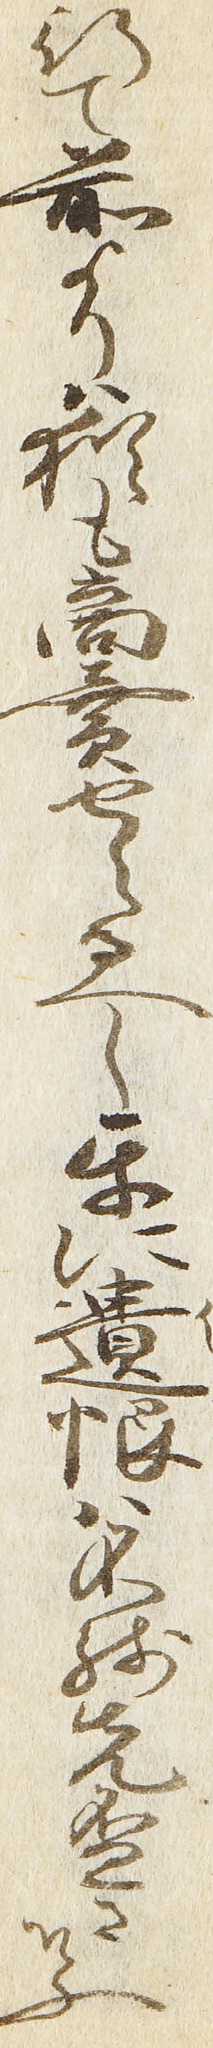行て前よりは猶も商売せらるへし互に遺恨は不残先盃さそふ
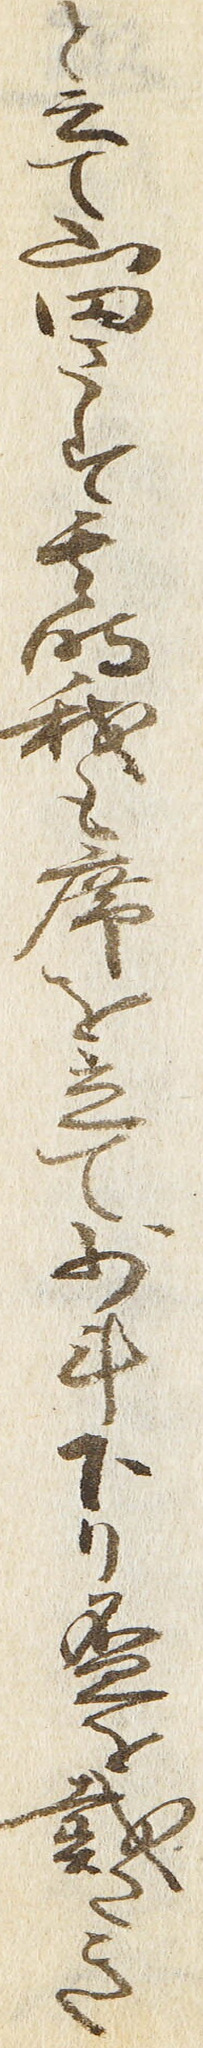と云て山田さす其時我も席を立て少斗下り盃を戴たき
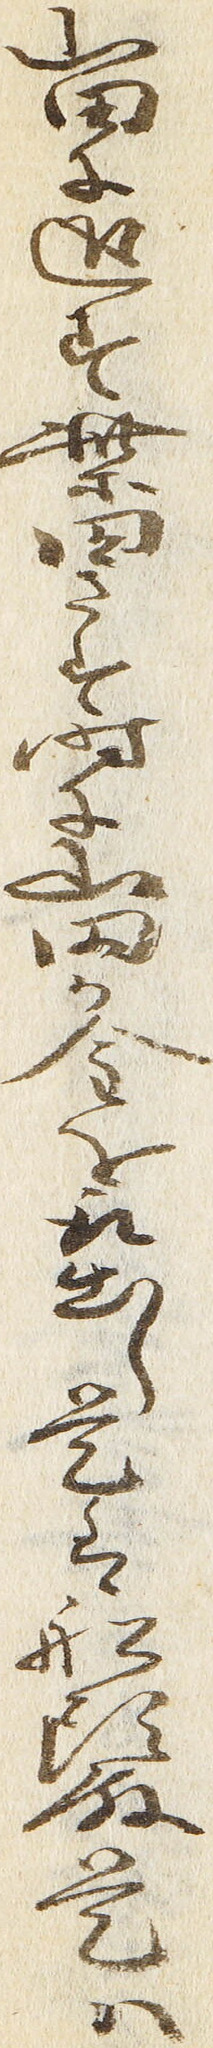山田に返す柴田さす時に山田か金を取出し是は船頭殿是は
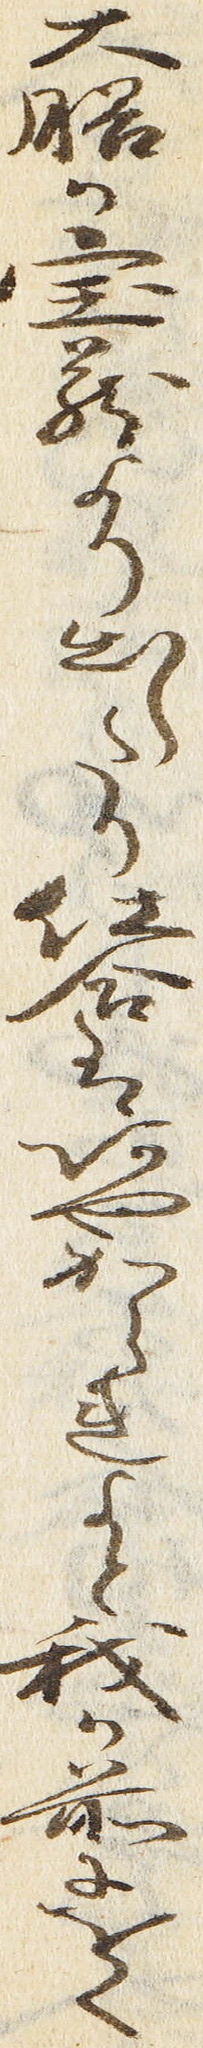大膳か宝蔵より出したり仕合はあやかられよと我か前にをく
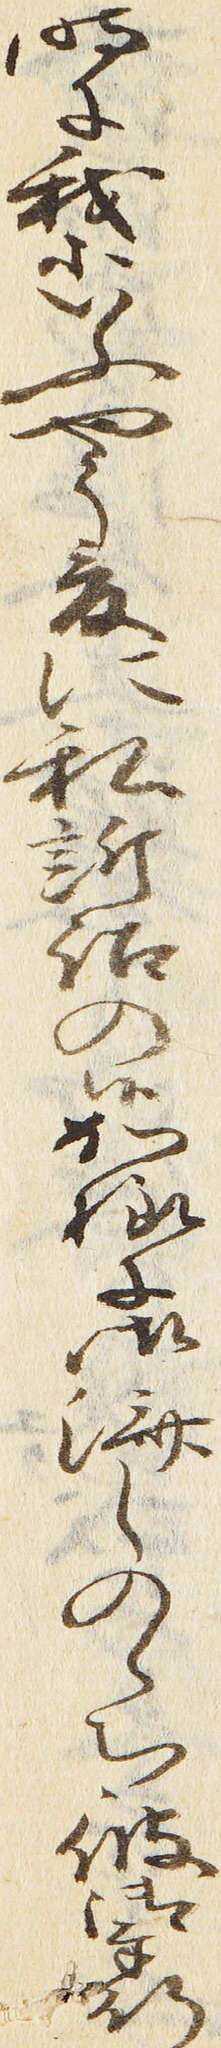時に我等いふやう爰に私訴訟の候か様に御済しのゝち彼御奉行
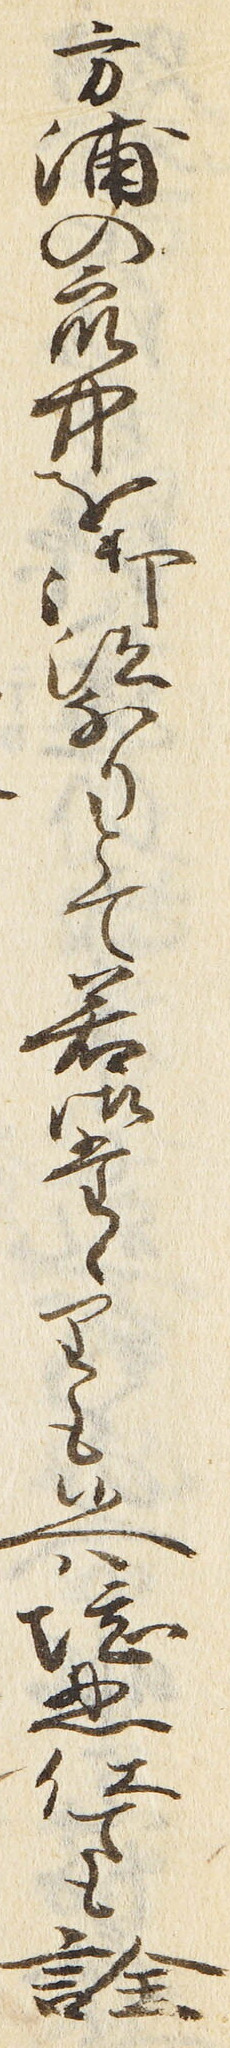方浦の衆中を御法なりとて若御たゝりも候へは堪忍仕ても詮
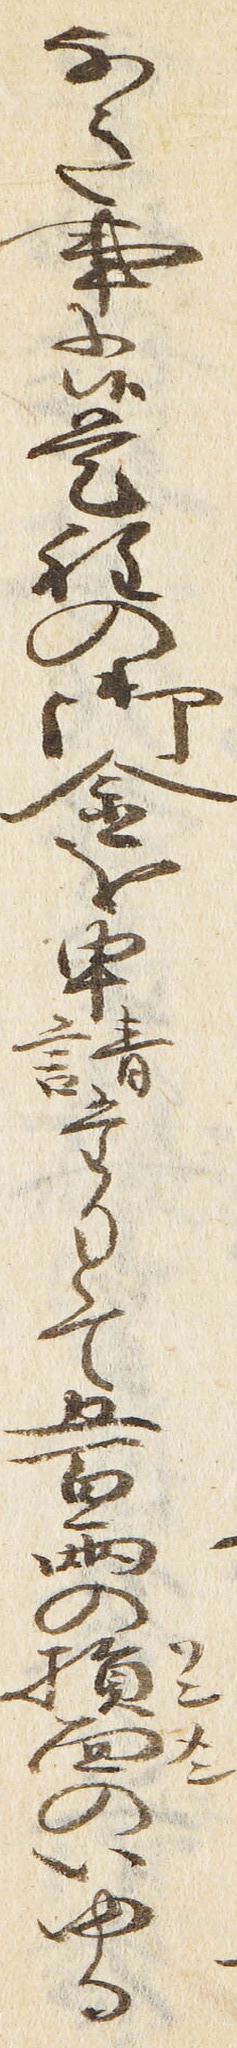なき事に候是程の御金を申請たりとて五百両の損面のいゆる
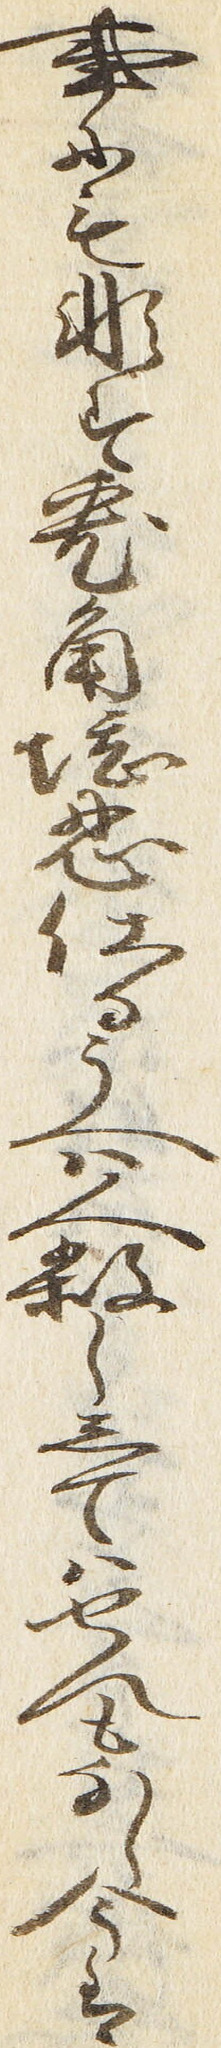事にも非す兎角堪忍仕るうへは人殺ししてはせんもなし今は
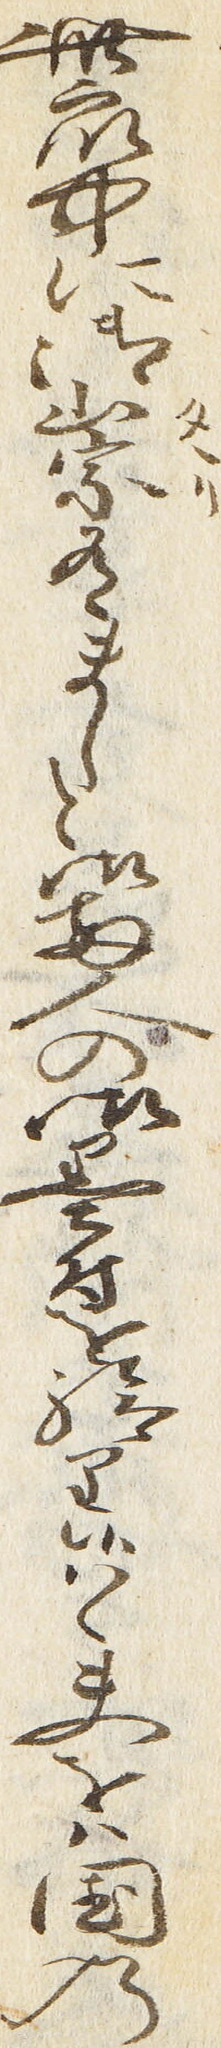此衆中に御祟有ましと御両人の御墨付を給り候はゝ夫をは国の
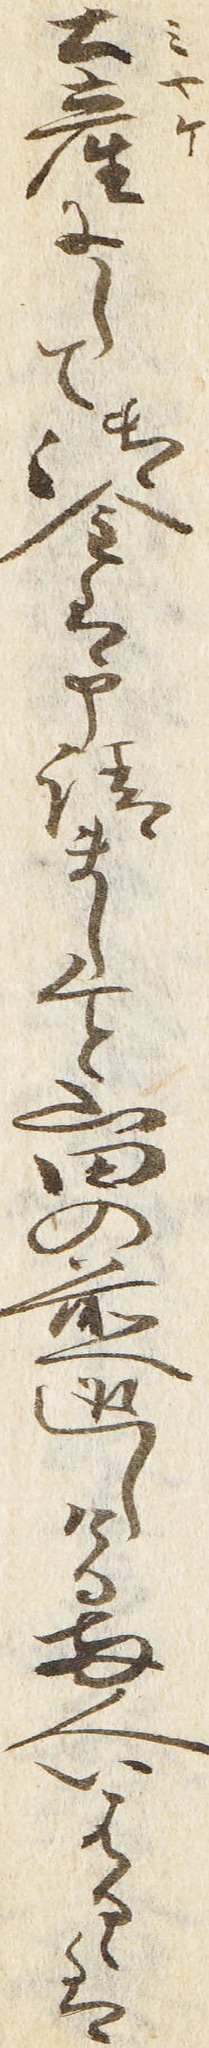土産にして御金は申請ましくと山田の前へ返しける両人いはるゝは
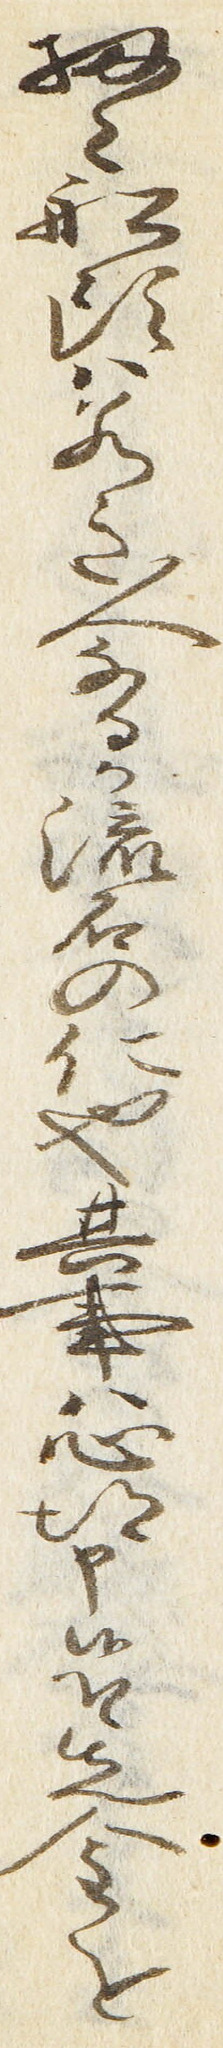扨々船頭は若き人なるか流石の仁也其事は心得申候そ先金を
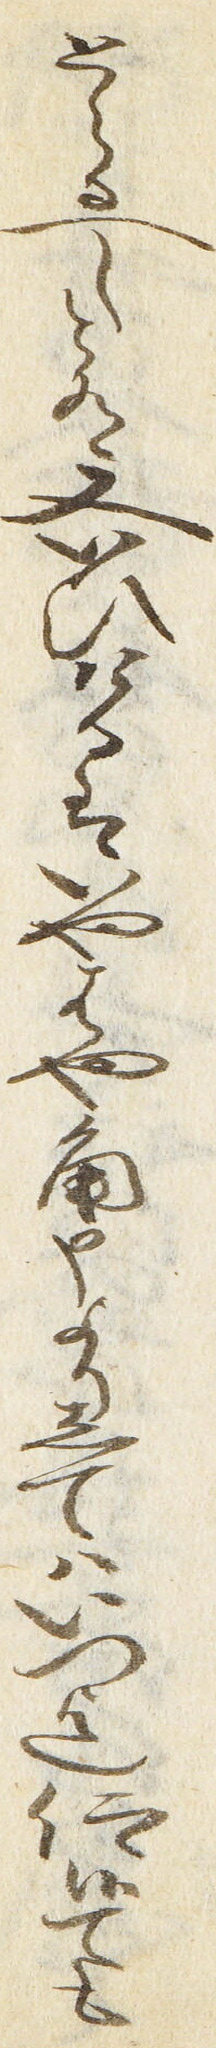とるへしと有又いひけるはいやはや角申よりしてはいつ迄仰候ても
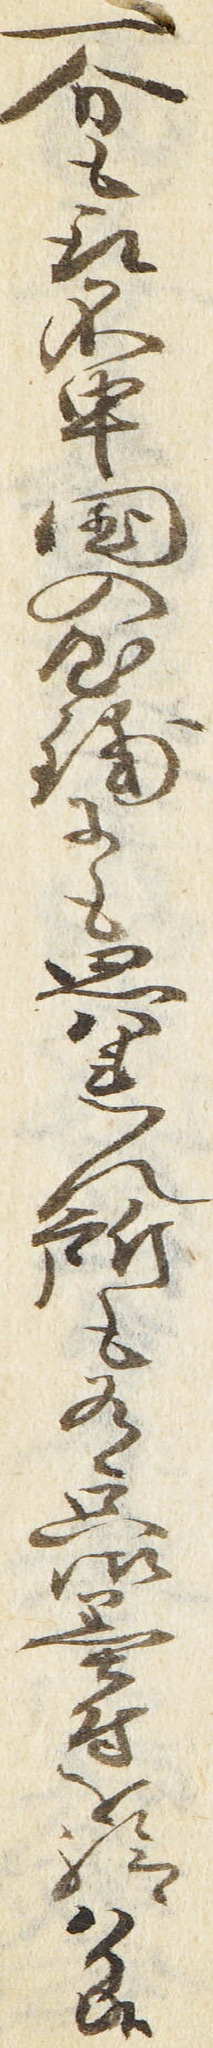一分も取不申国の屋鋪にも思はれん所も有只御墨付を給はり候
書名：海陸世話日記
